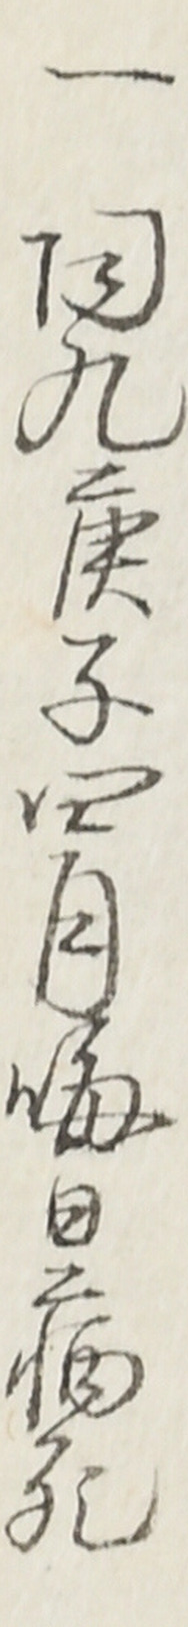一同九庚子四月晦日病死

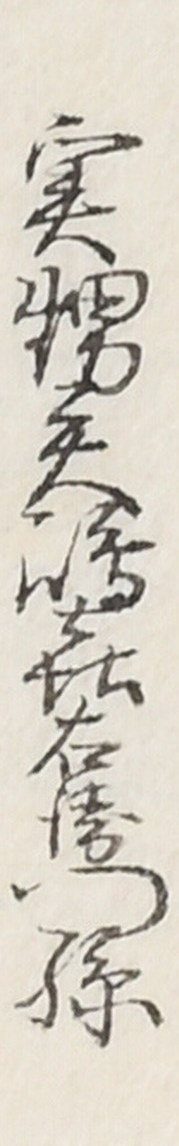実甥矢嶋喜右衛門孫
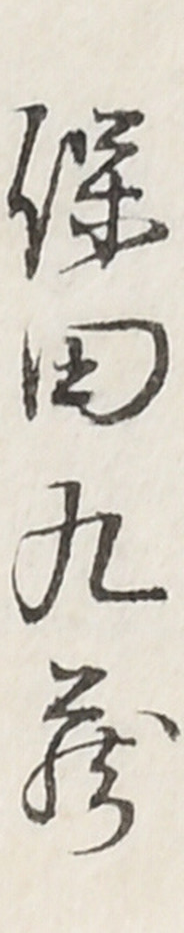保田九蔵
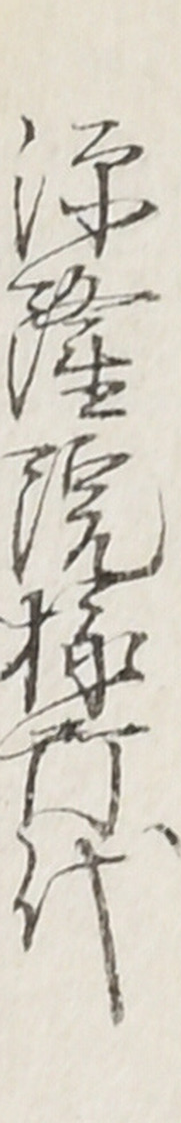源隆院様御代
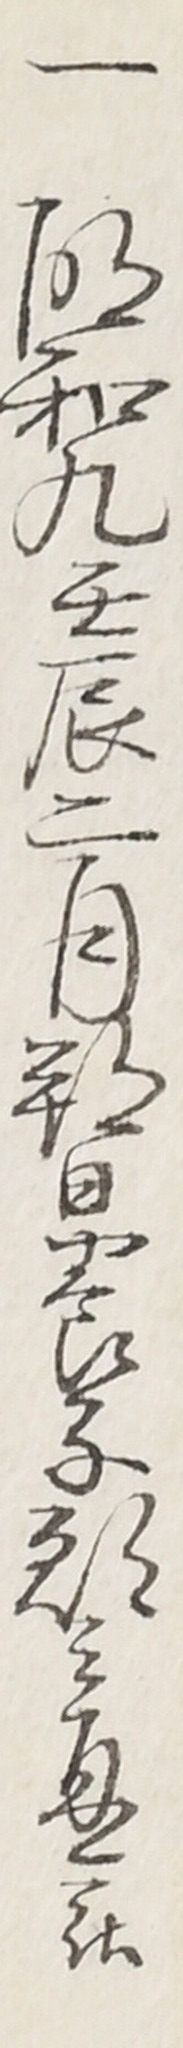一明和九壬辰二月朔日養子願之通被
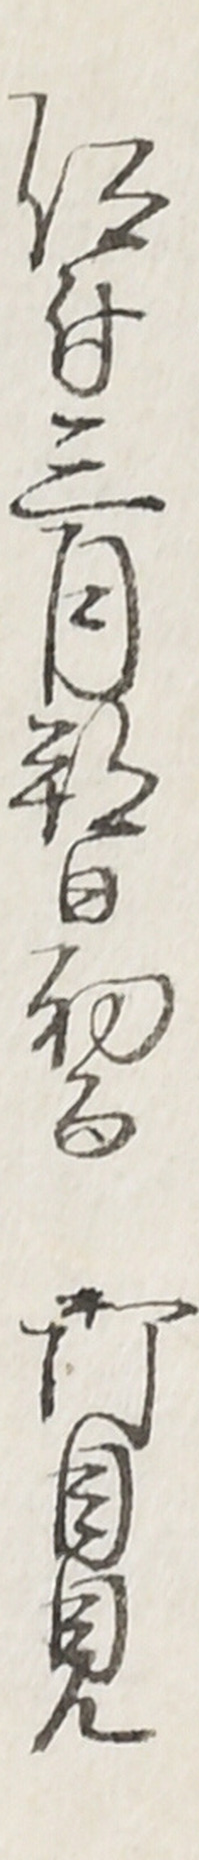仰付三月朔日初而御目見
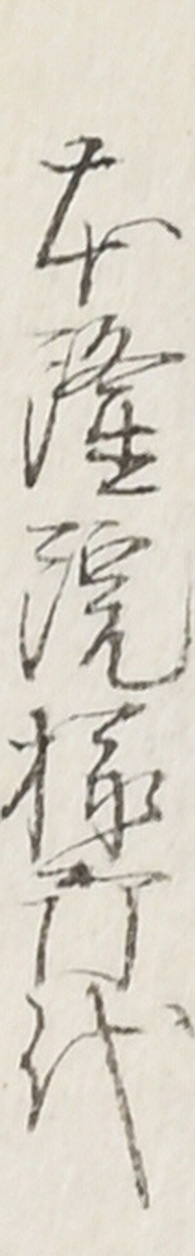本隆院様御代
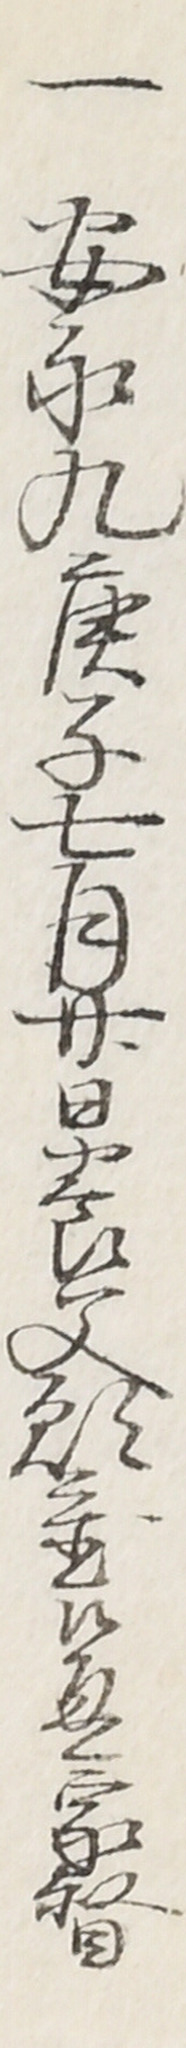一安永九庚子七月廿日養父願置候通家督
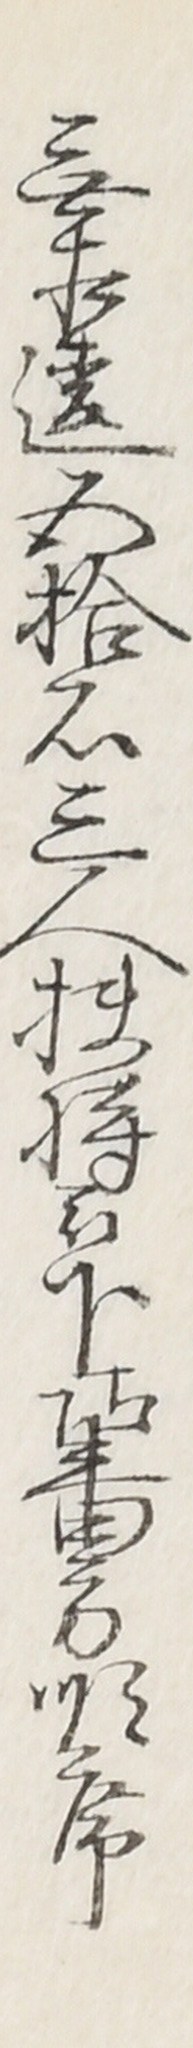無相違五拾石三人扶持被下御番方順席
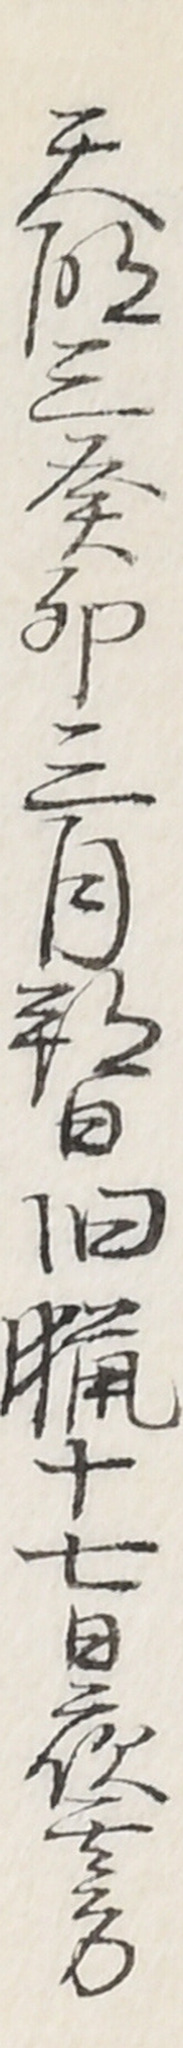一天明三癸卯三月朔日旧臘十七日夜其方
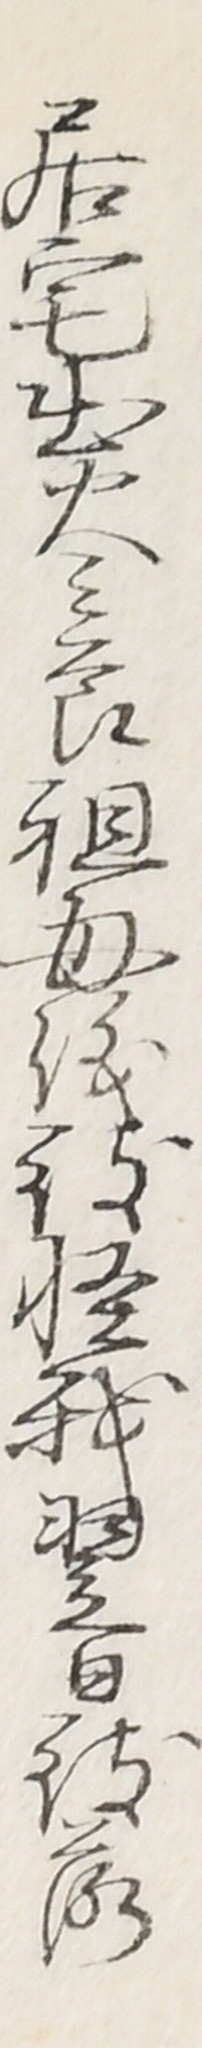居宅出火之節祖母儀致怪我翌日致落
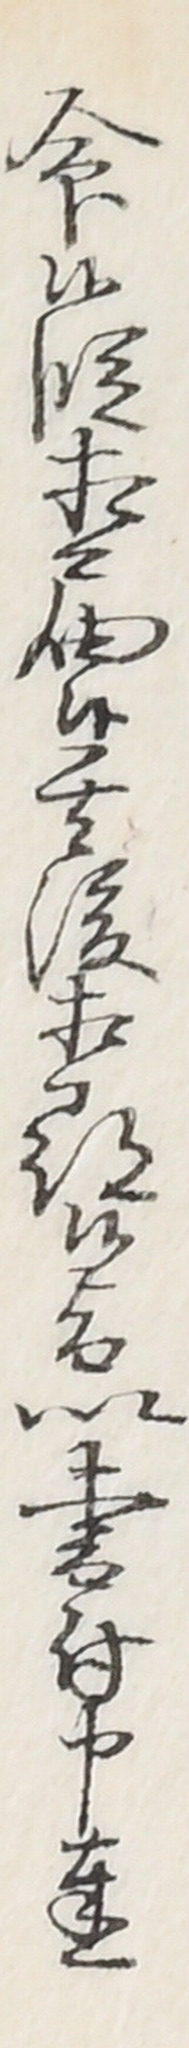命候段相届候其後相尋候旨以書付申達
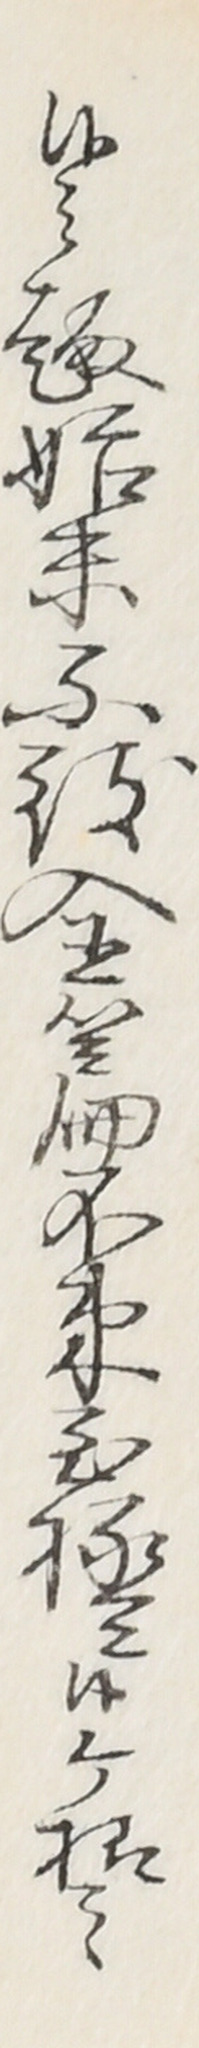候之趣始末不致金篇不束至極ニ候ヶ様之
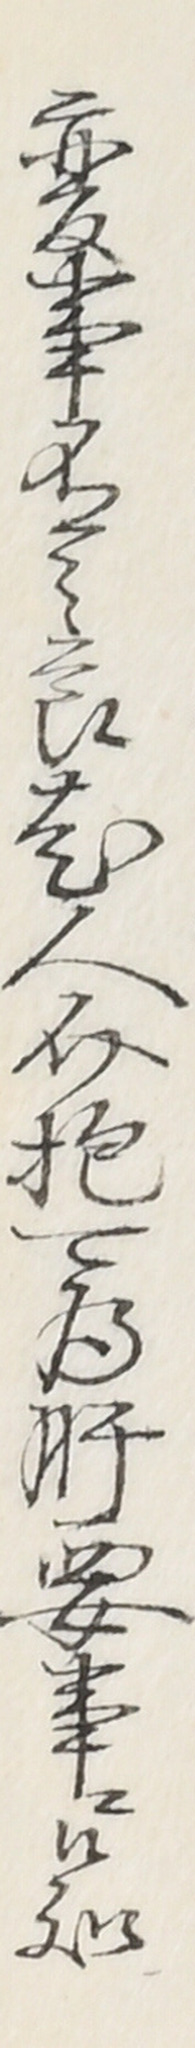変事有之節老人介抱可為肝要ニ候処
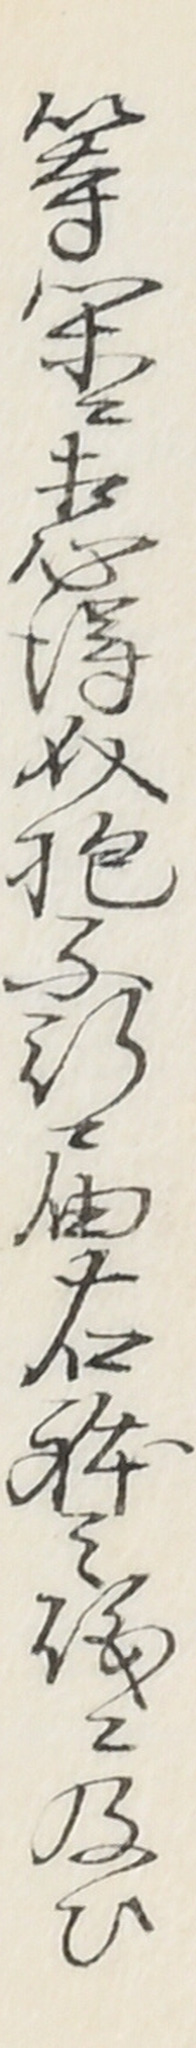等閑ニ相心得介抱不行届右躰之儀ニ及ひ
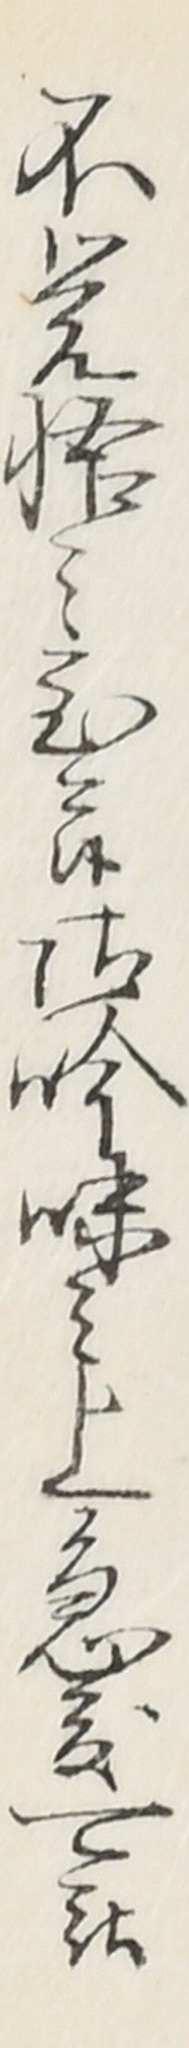不覚悟之至ニ候御吟味之上急度可被
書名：給人諸士勤仕録（七）
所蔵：伊那市立高遠町図書館・合同会社AMANE
